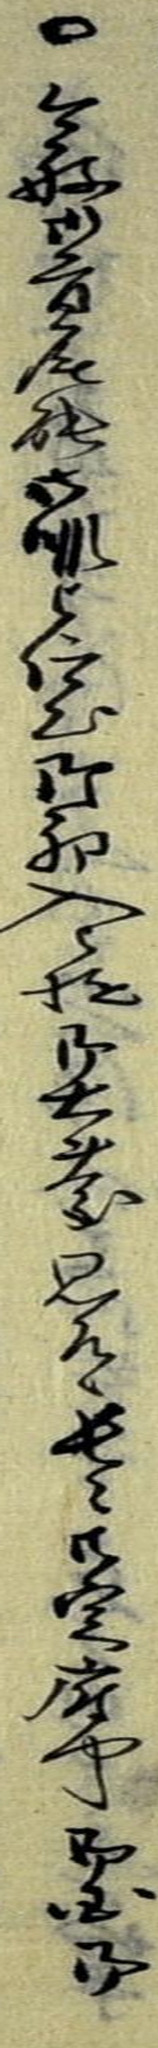〇今般御首尾能御暇被仰出御初入被遊御大慶思召候長々御定府中御国御
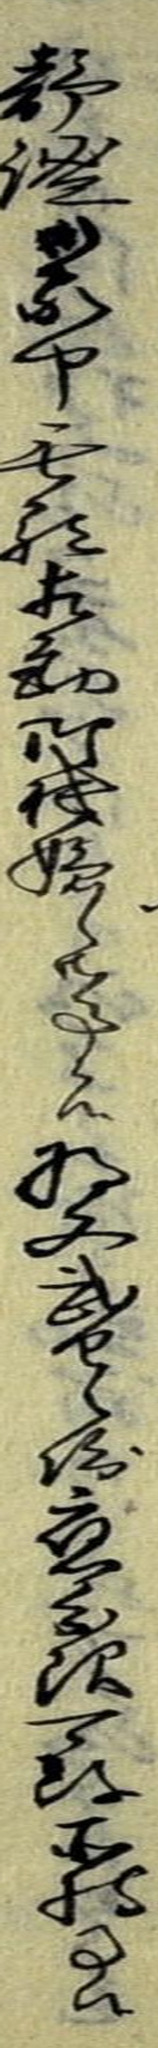静謐御家中無難相勤御機嫌之御事に候将又武具之儀応分限可致所持事候
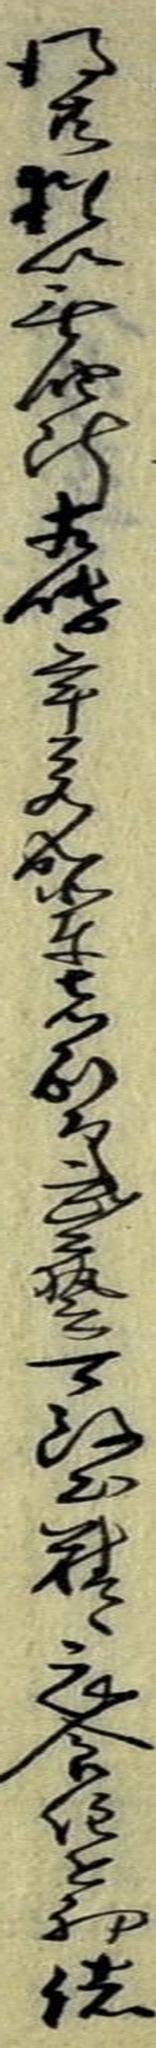得共猶以無油断相嗜年若成輩者別而武芸可致出精候衣食住を初諸
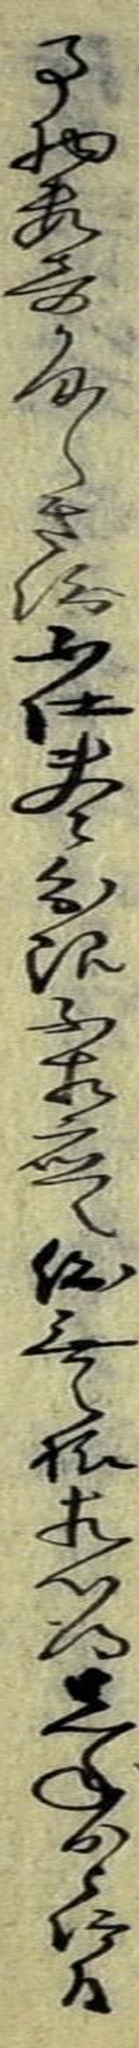事物数寄かましき儀不仕夫々分限不相応之儀無之様相心得先年ゟ被仰付
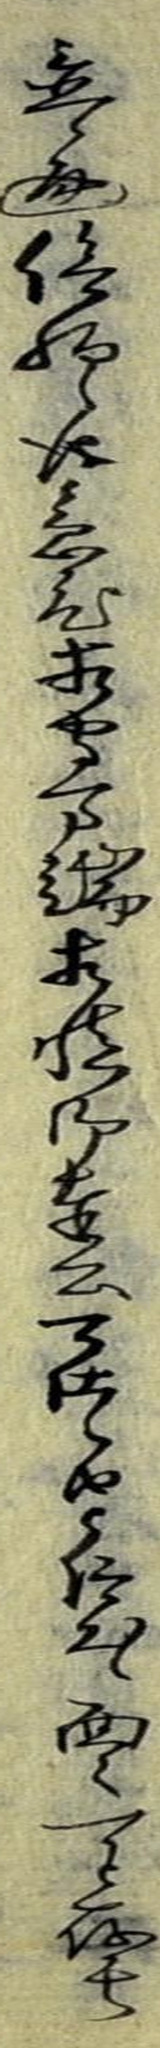置候通倹約之儀急度相守万端相慎御奉公可仕候由被仰出候面々可被存其
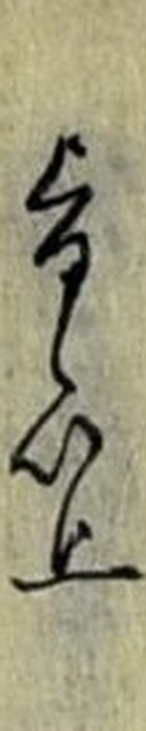旨候以上
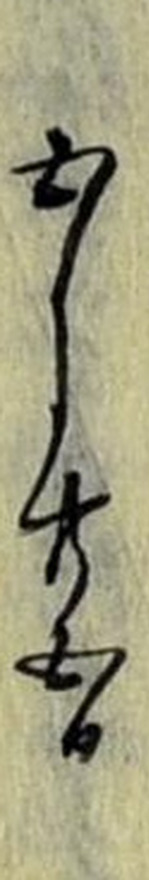四月廿五日
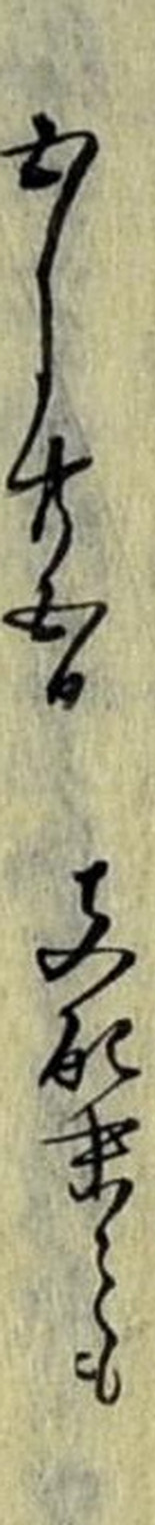五月廿五日支配末々へも
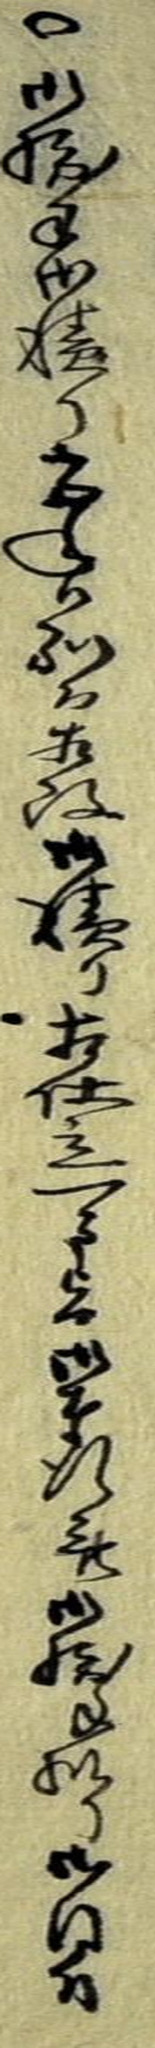〇御勝手御積り当年は別而相改御積り相仕立可申旨御奉行并御勝手掛り御目付
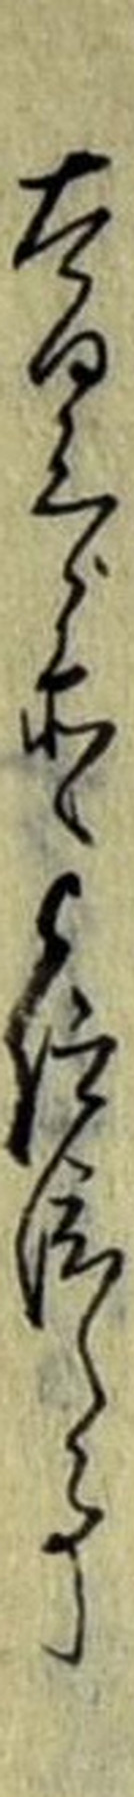太田三郎兵衛へ被仰渡候事

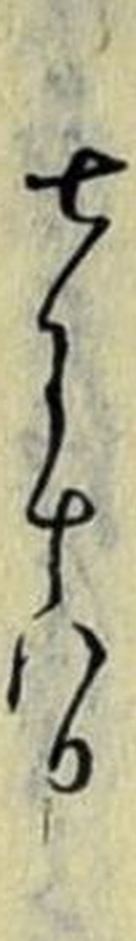七月十八日
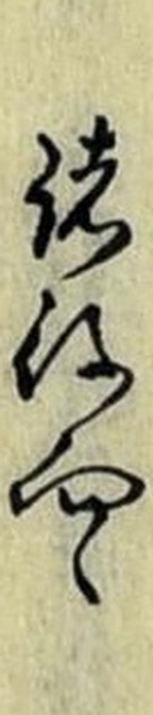諸役向へ
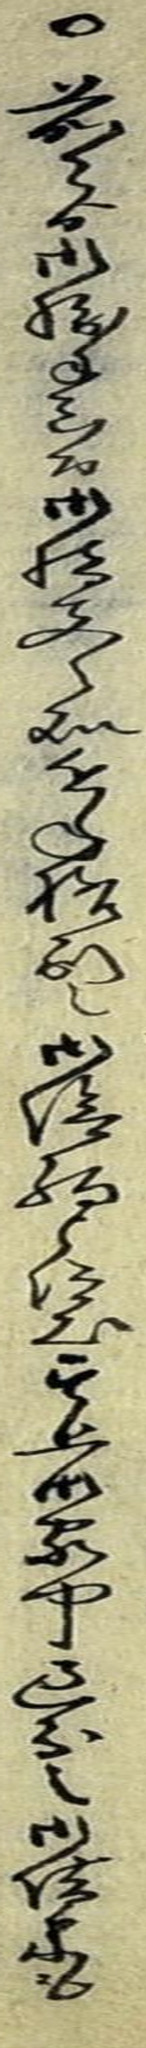〇前々ゟ御勝手至而御指支之処近年格別之御倹約被仰出其上御家中過分之御借米も
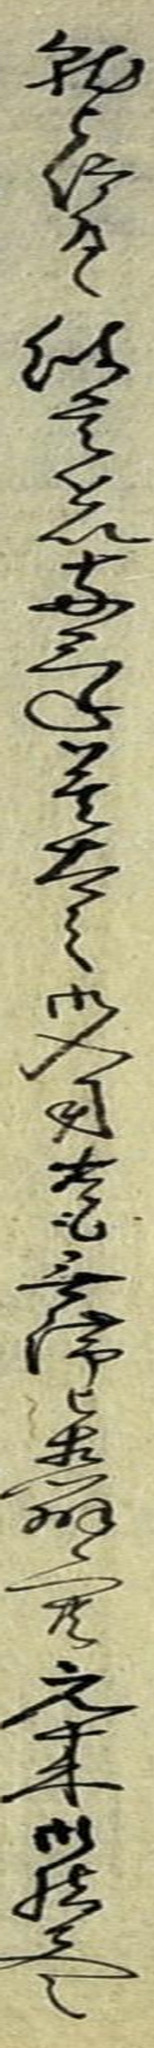就被仰付候彼是を以両三年莫太之御入用共も無滞被相弁候へ共元来御指支之
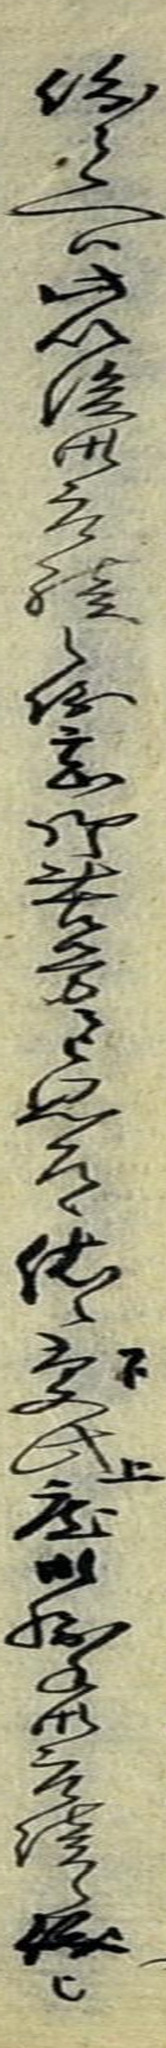儀に候へは此以後御取続之儀甚御苦労に被思召候依之尚又此度御勝手御取続之儀被
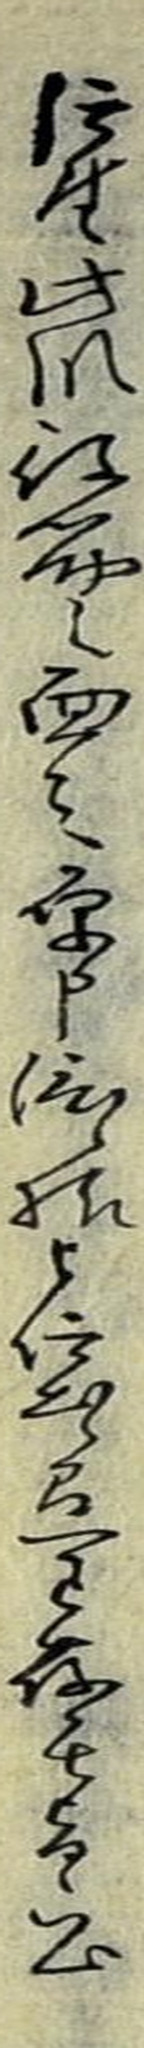仰付候此段役筋之面々へ厚申渡候様被仰出候間可被存其旨候以上
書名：命令之部 二
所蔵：福井県文書館 Fukui Prefectural Archives
